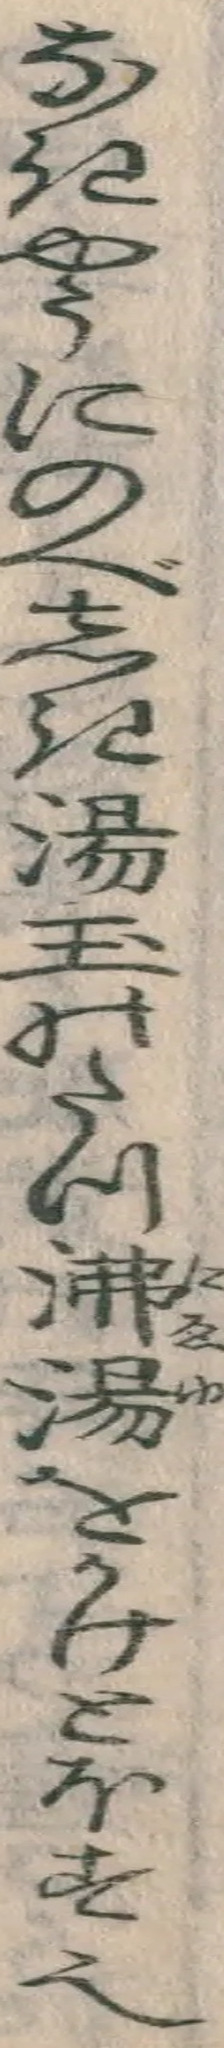なきやうにのべしき湯玉のたつ沸湯をかけとほす也
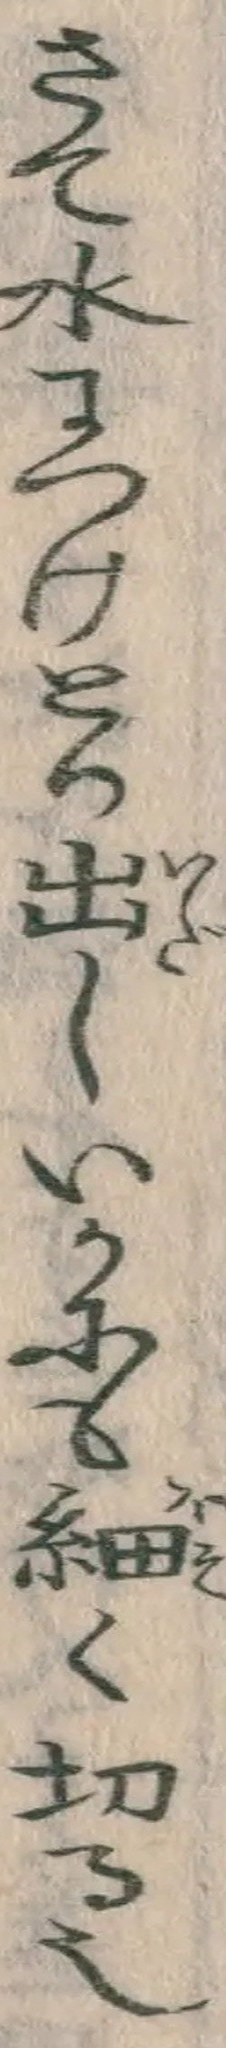さて水につけとり出しいかにも細く切る也
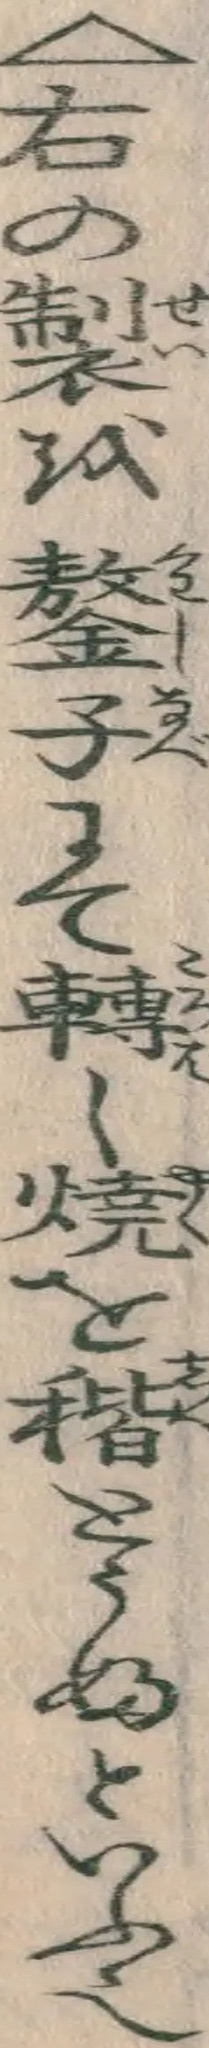△右の製を鏊子にて転し焼を稭とうふといふ也
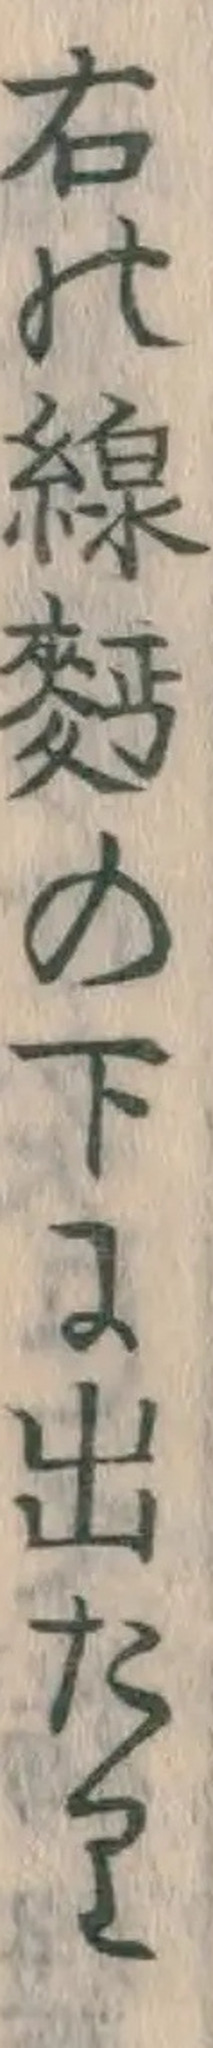茶とうふの下に出たり
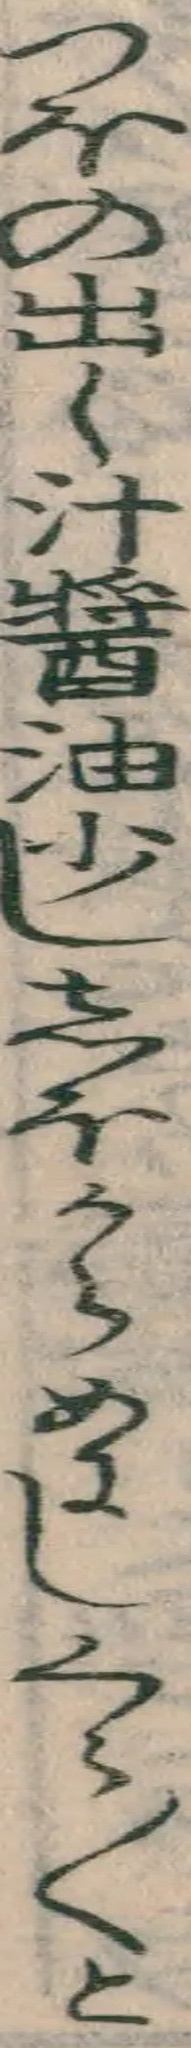つほの出し汁醤油少ししほからめにしくら〳〵と
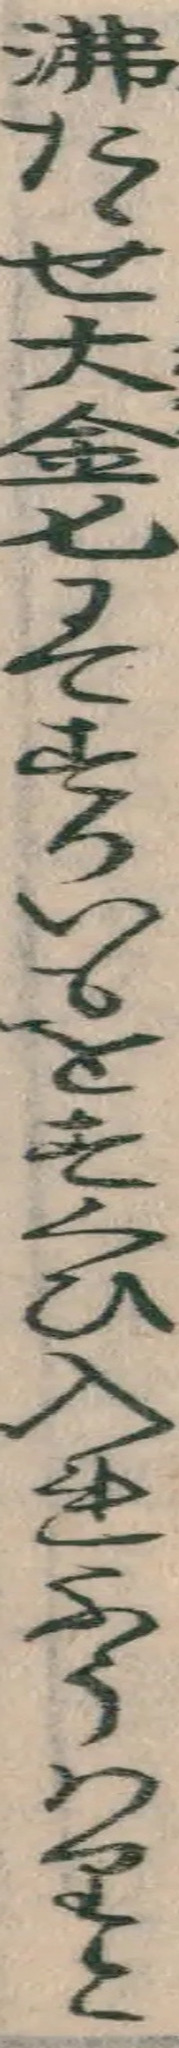沸たゝせ大金匕にてすりいもをすくひ入れふうはりと
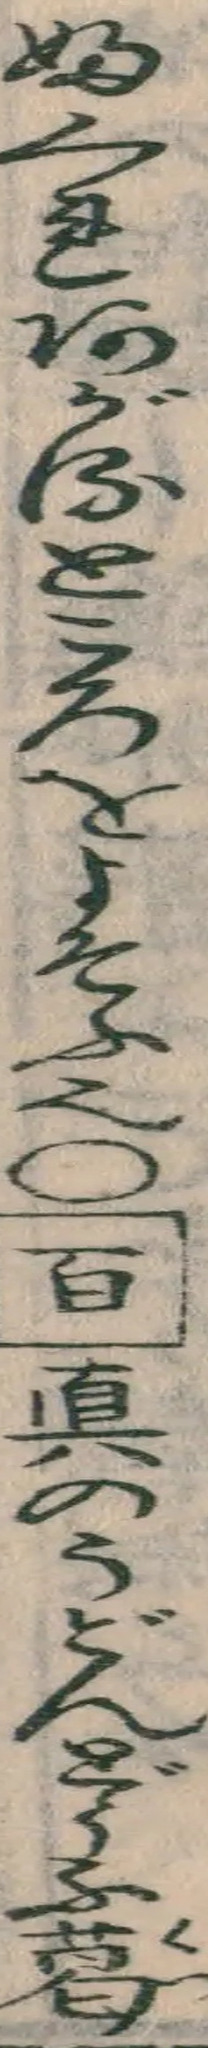ふくれあがるところをよそふ也○[百]真のうどんどうふ葛
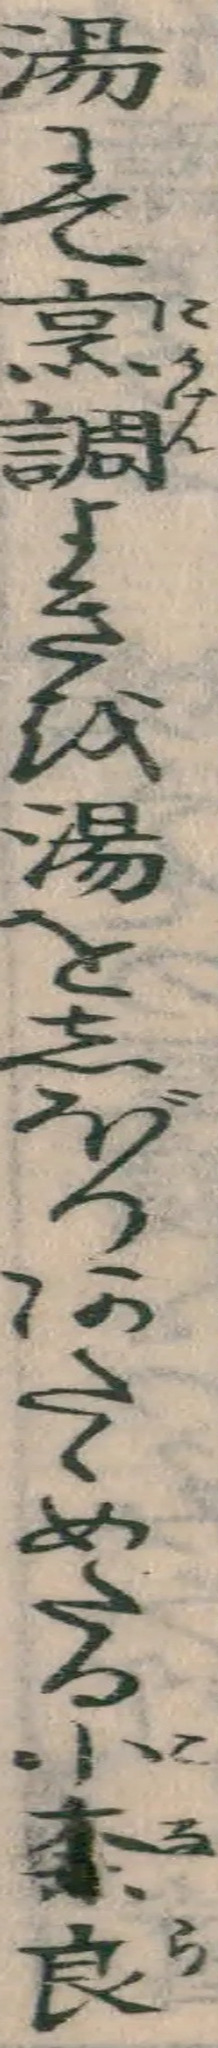湯にて烹調よきを湯をしぼりあたゝめたる小奈良
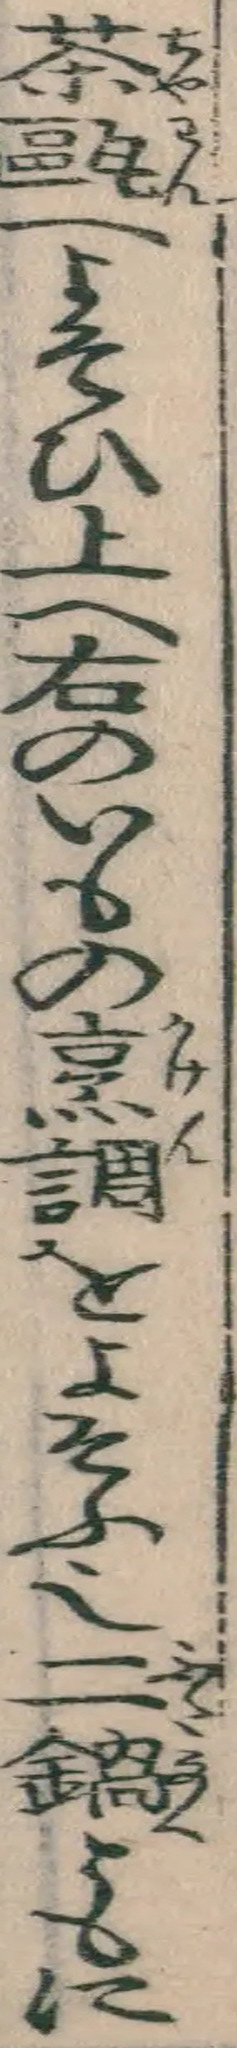茶甌へよそひ上へ右のいもの烹調をよそふ也二鍋ともに
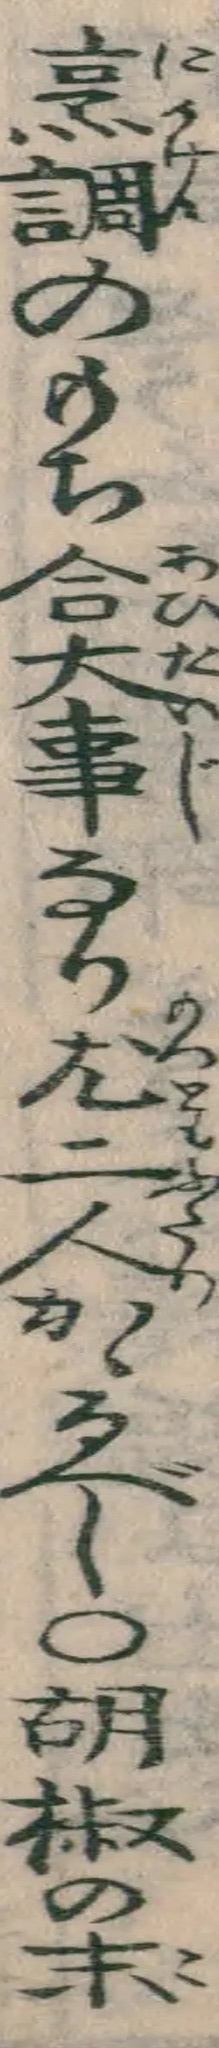烹調のもち合大事なり尤二人かゝるべし○胡椒の末
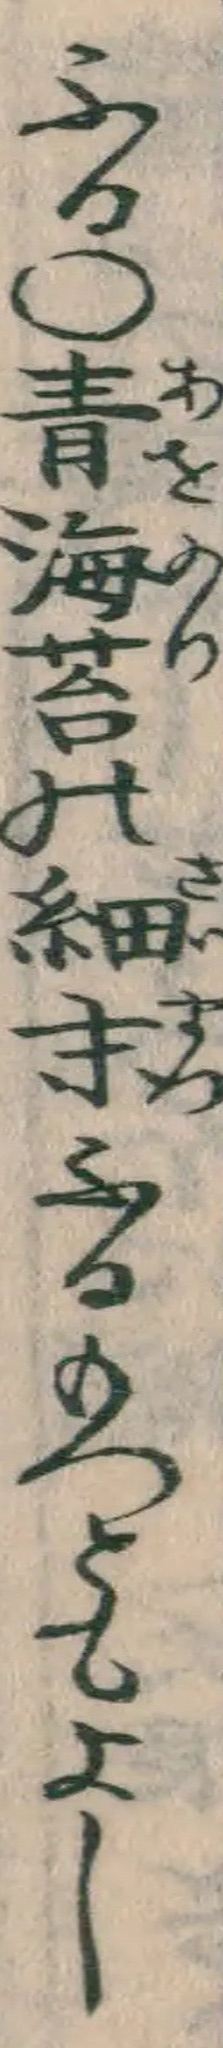ふる○青海苔の細末ふるもつともよし
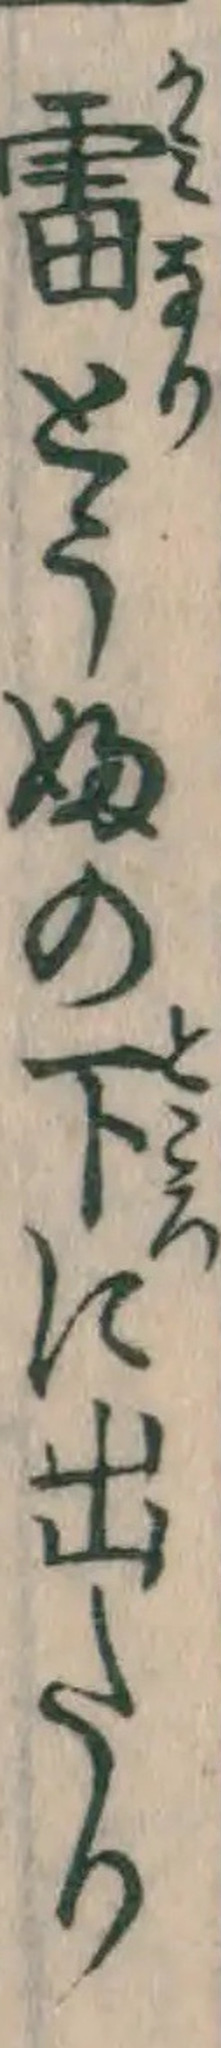茶とうふの下に出たり

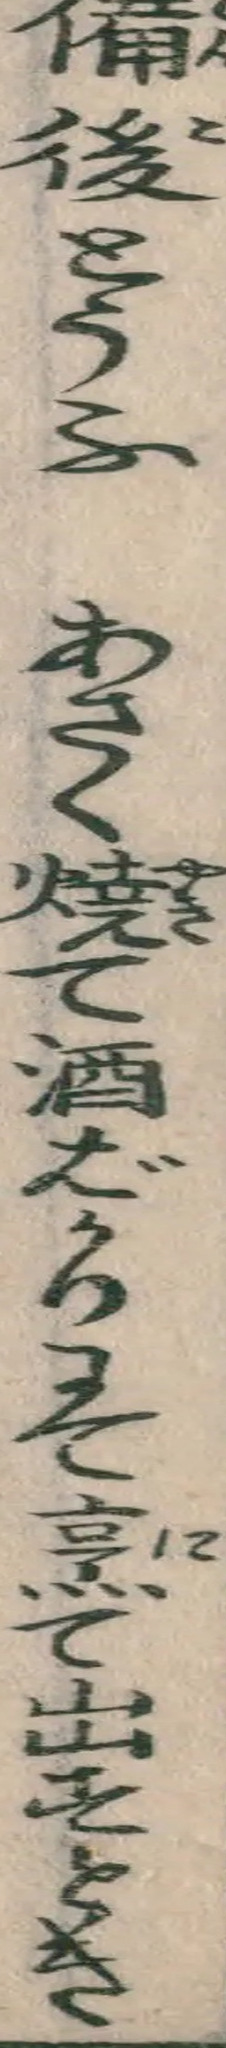[四十九]備後とうふあさく焼て酒ばかりにて烹て出すとき
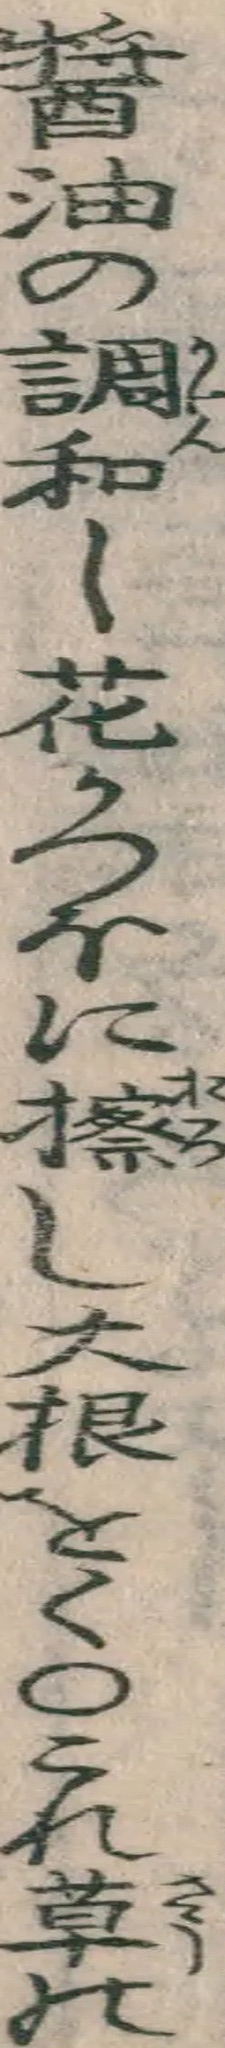醤油の調和し花かつほに擦し大根をく○これ草の
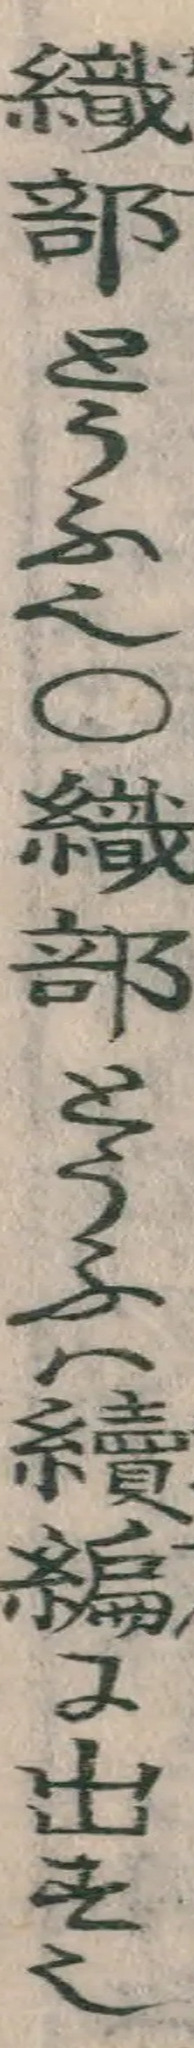織部とうふ也○織部とうふは続編に出す也
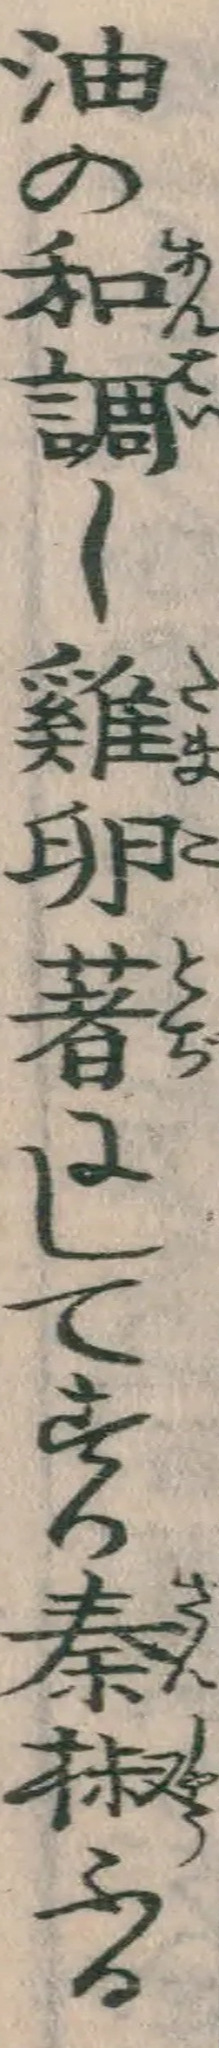油の和調し雞卵著にしてすり奏椒ふる
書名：豆腐百珍. [正編]
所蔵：国立国会図書館 National Diet Library, JAPAN
